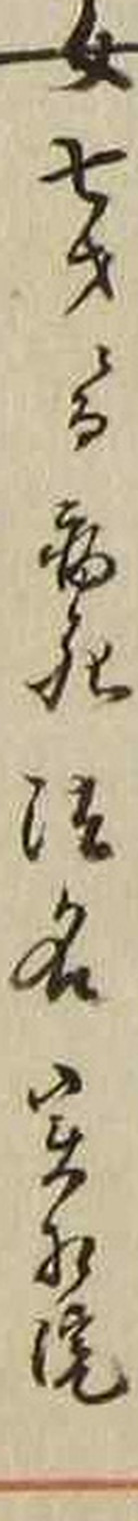七才ニ而病死法名実相院
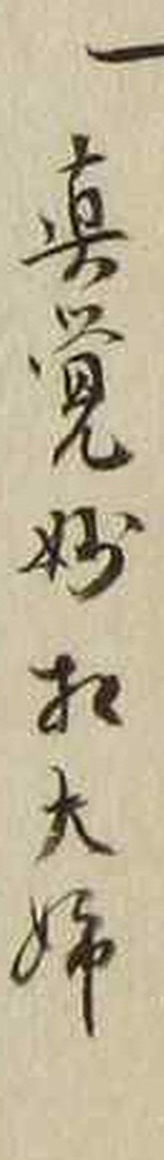真覚妙相大姉

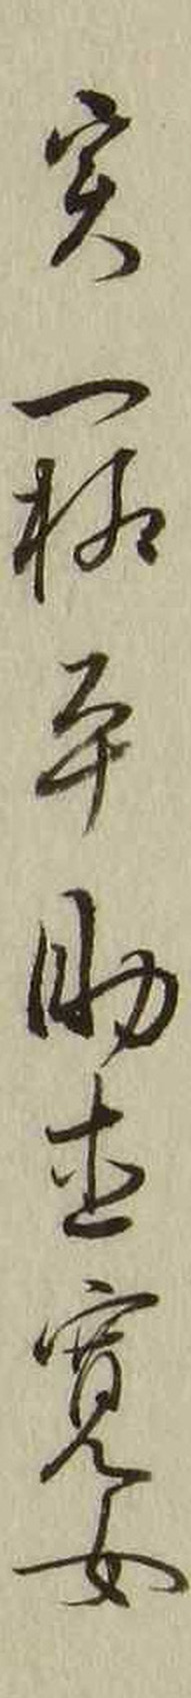実一柳平助直寛女
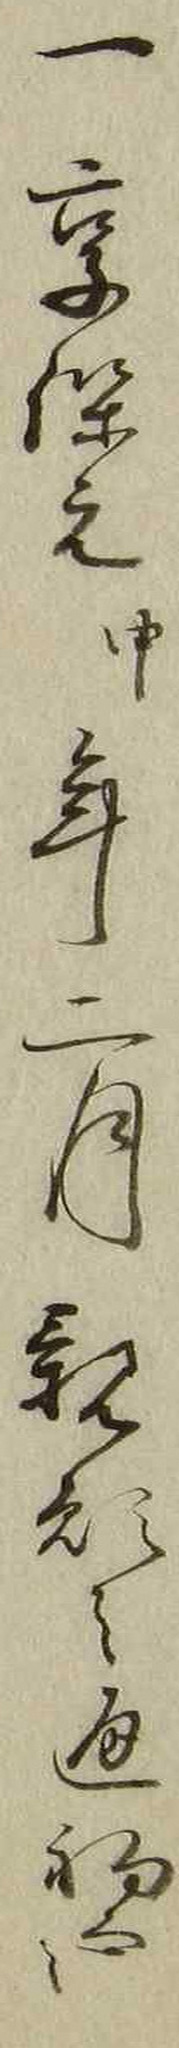一享保元申年二月親願之通初而之
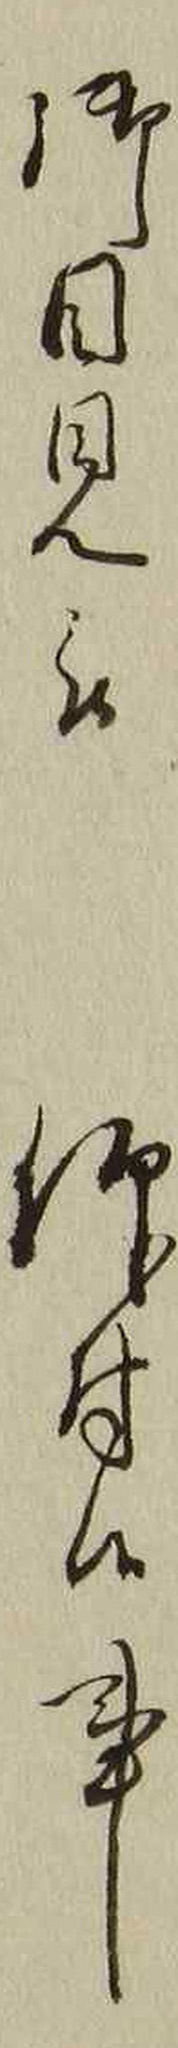御目見被仰付候事
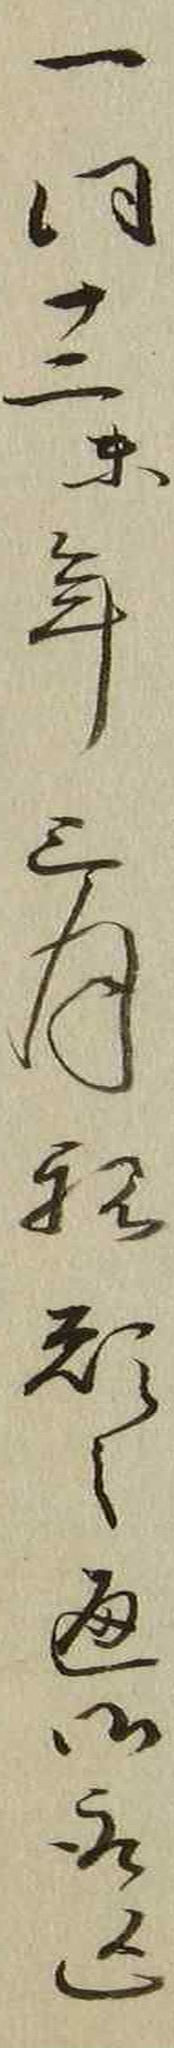一同十二未年三月親願之通御取込
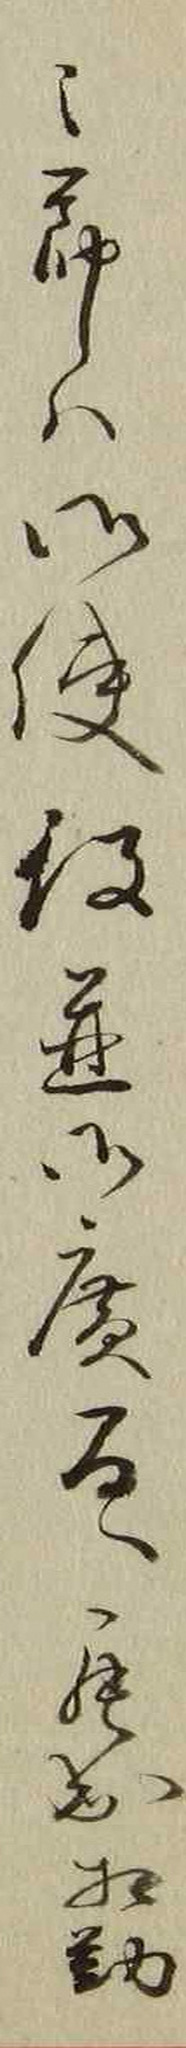之節ハ御使役並御広間へ罷出相勤
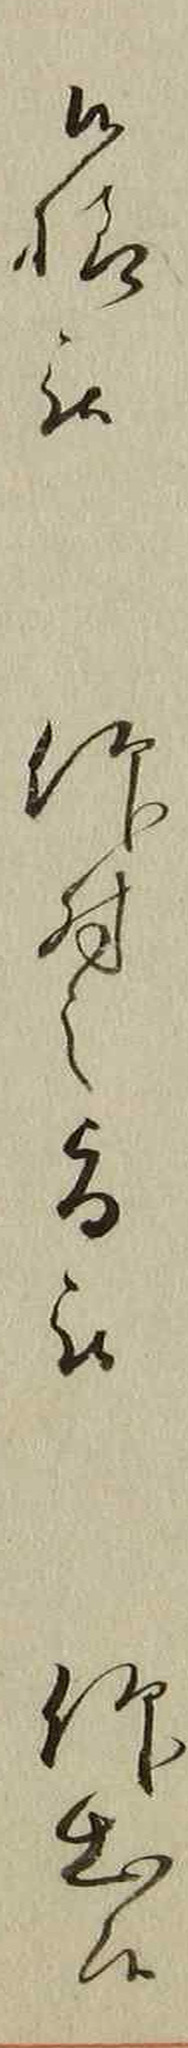候様被仰付之旨被仰出候
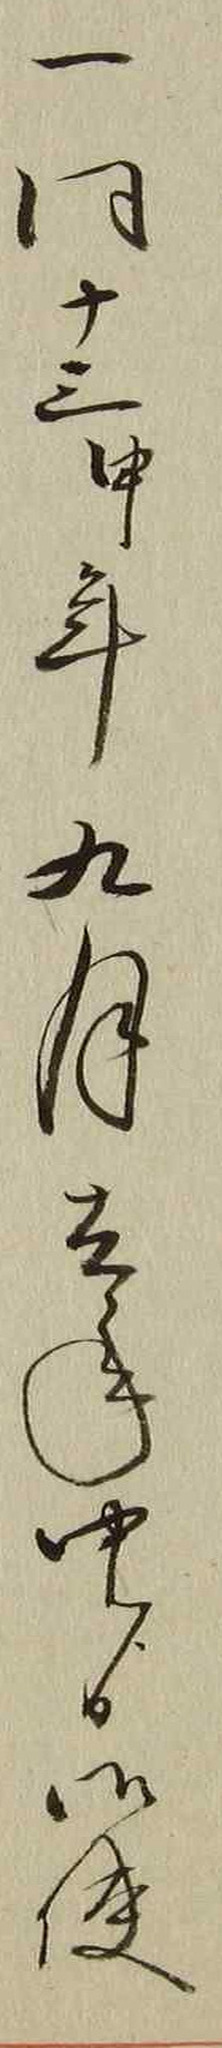一同十三申年九月去年中ゟ御使
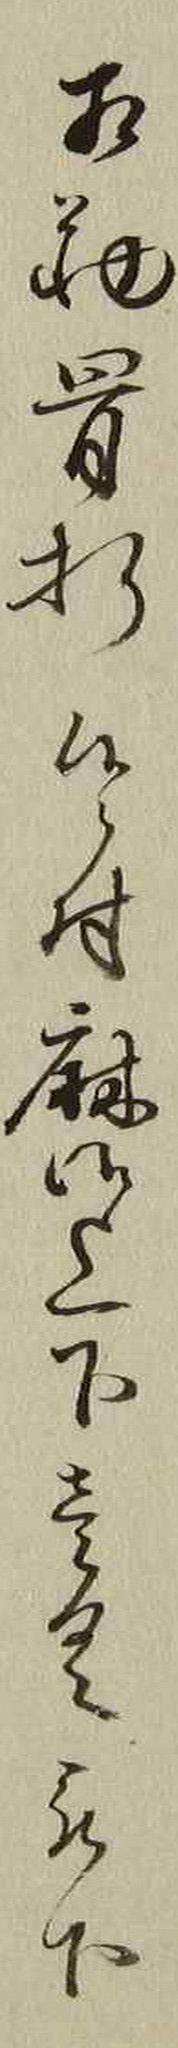相勤骨折候ニ付麻御上下壱具被下
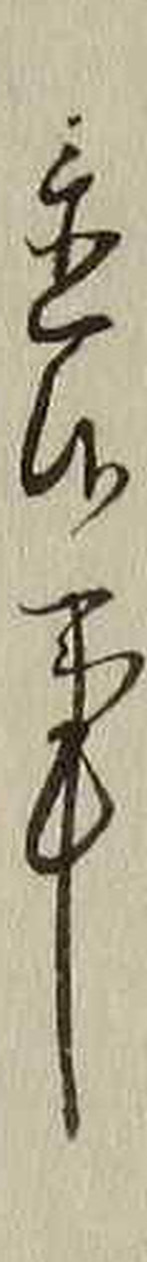置候事
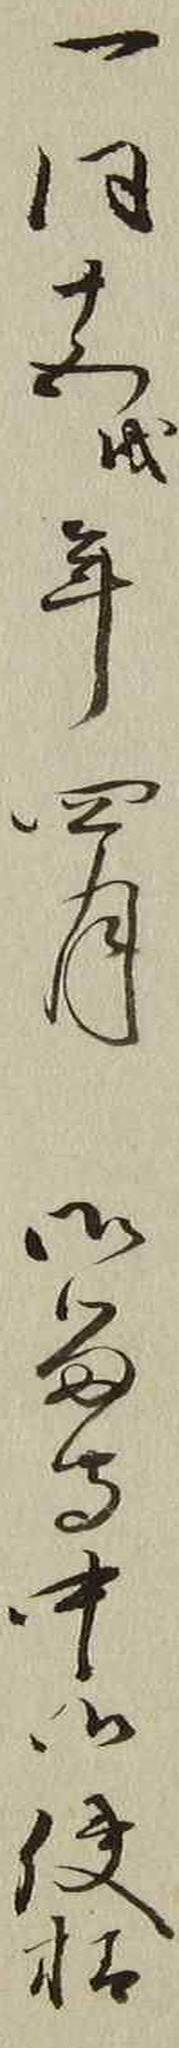一同十五戌年四月御留守中御使精
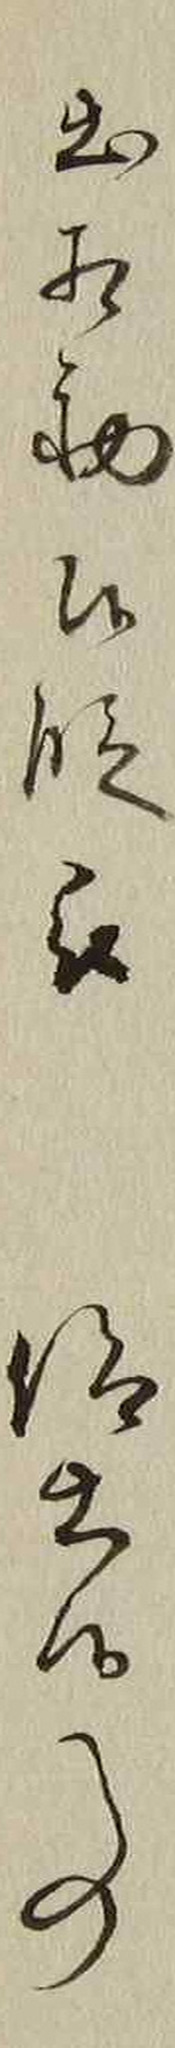出相勤候段被仰出候事
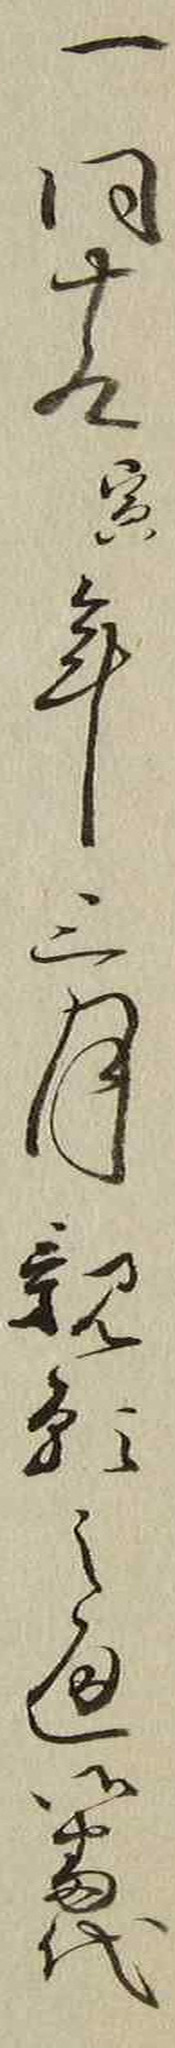一同十九寅年三月親願之通御番代
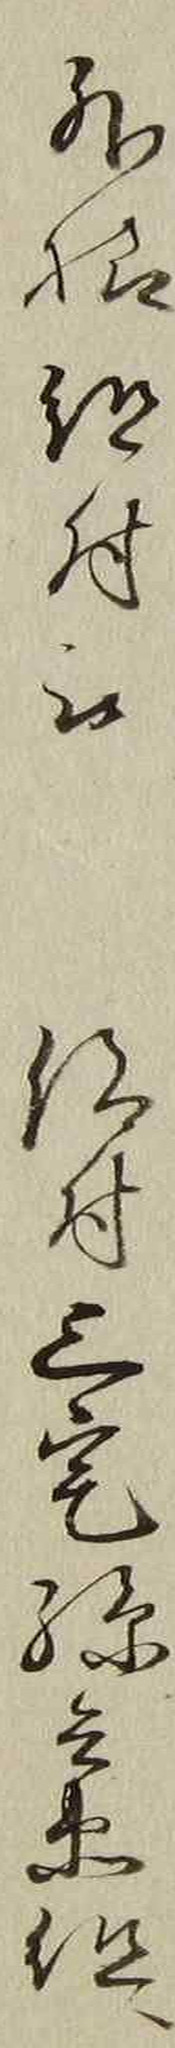外様組付被仰付三宅孫兵衛組へ
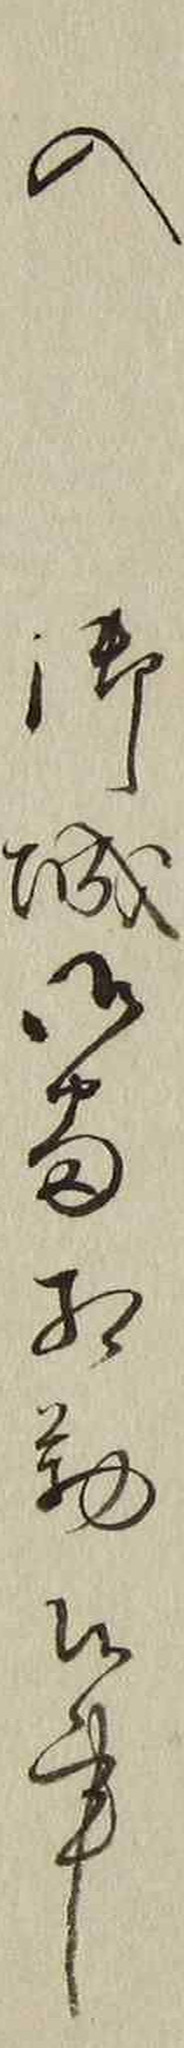入御城御番相勤候事
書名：諸士系譜　巻之2　い之部2
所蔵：会津若松市立会津図書館
